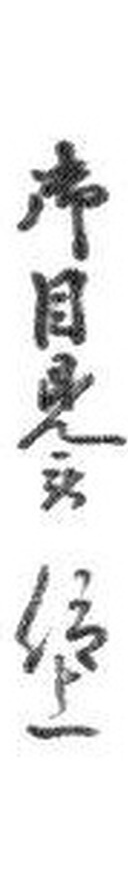御目見被仰上
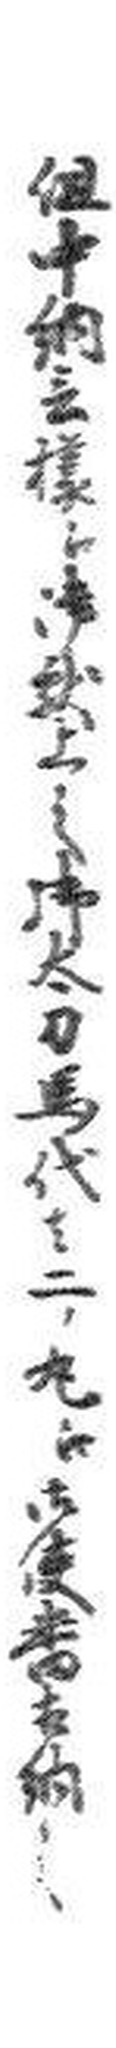但中納言様江御献上之御太刀馬代者二ノ丸江御使番相納之

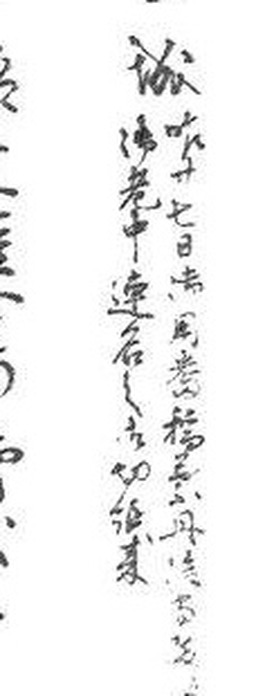御老中連名之御切紙来
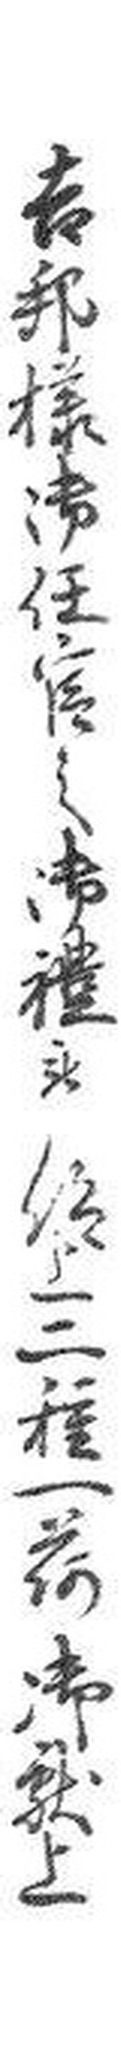吉邦様御任官之御礼被仰上二種一荷御献上
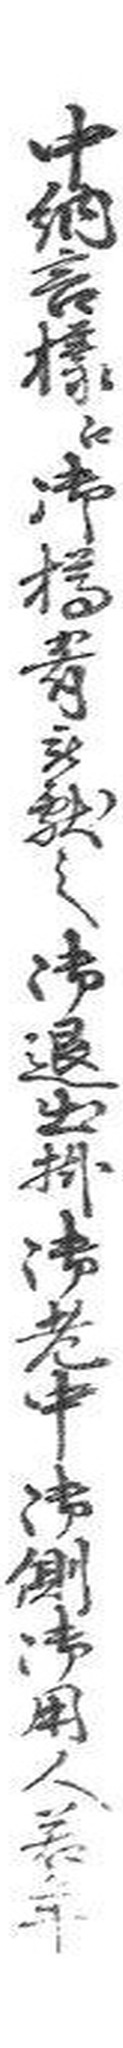中納言様江御樽肴被献之御退出掛御老中御側御用人若年
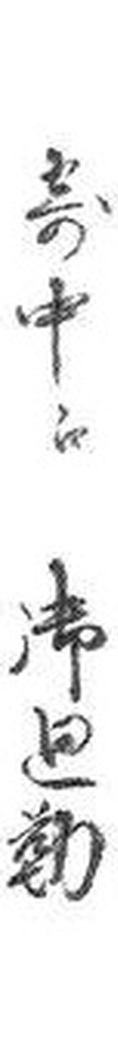寄中江御廻勤
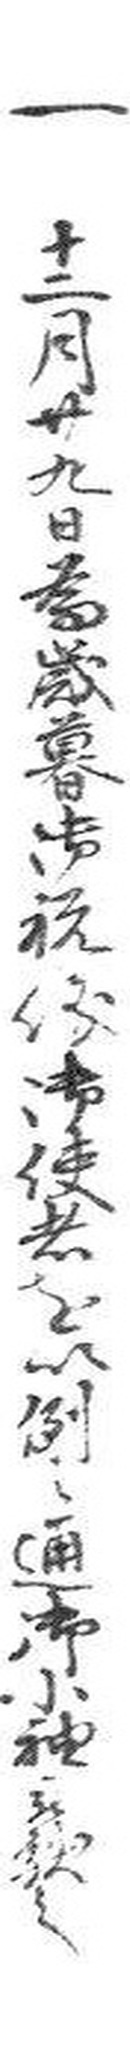一十二月廿九日為歳暮御祝儀御使者を以例之通御小袖被献之
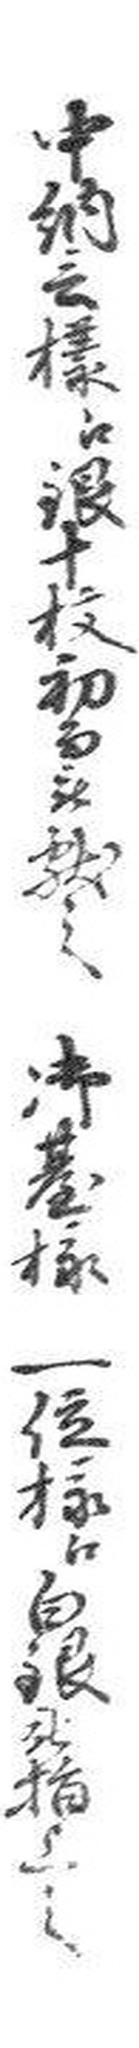中納言様江銀十枚初而被献之御台様一位様江白銀被指上之
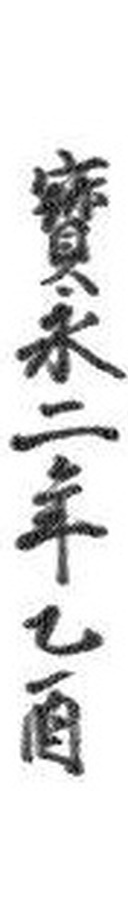宝永二年乙酉
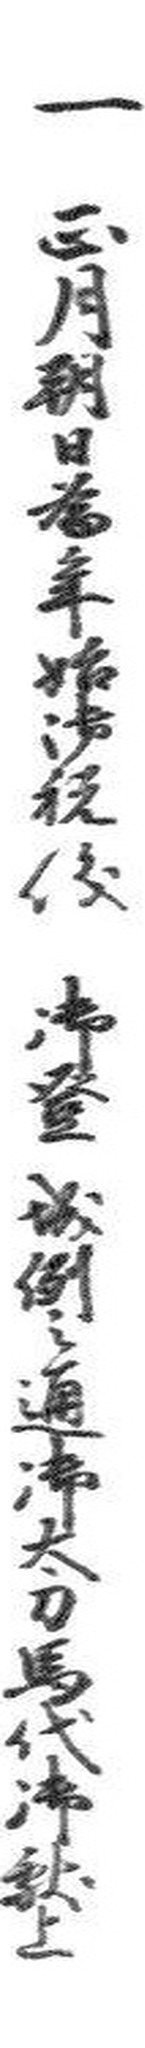一正月朔日為年始御祝儀御登城例之通御太刀馬代被献上
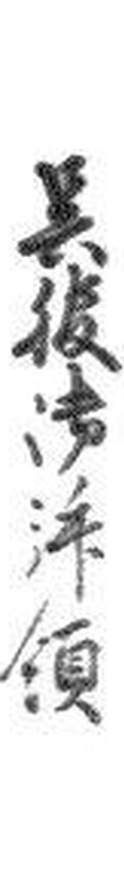呉服御拝領
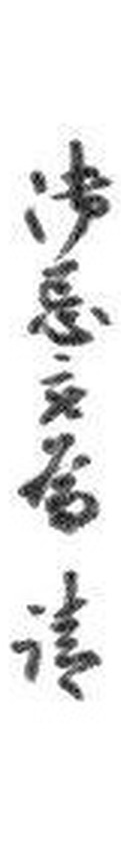御忌被為請
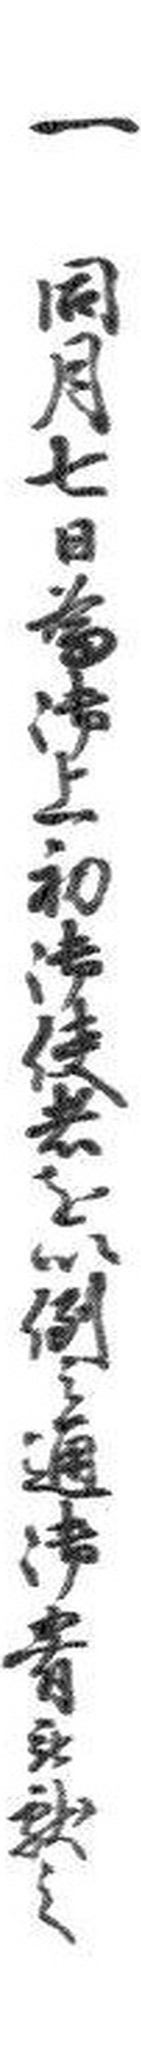一同月七日為御上初御使者を以例之通御肴被献之

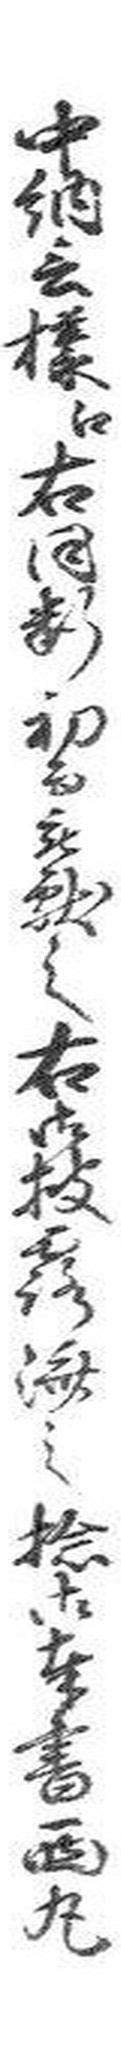中納言様江右同断初而被献之右御披露済之捻御奉書西丸
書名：家譜 二十三 吉品公 従宝永元年到同二年
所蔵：福井県文書館 Fukui Prefectural Archives
